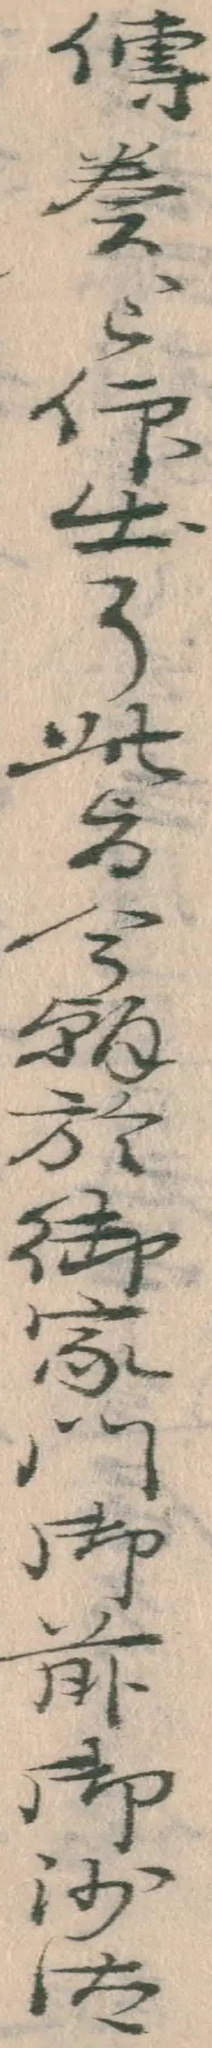傳奏と仰出了此旨今朝於御家門御前御沙汰
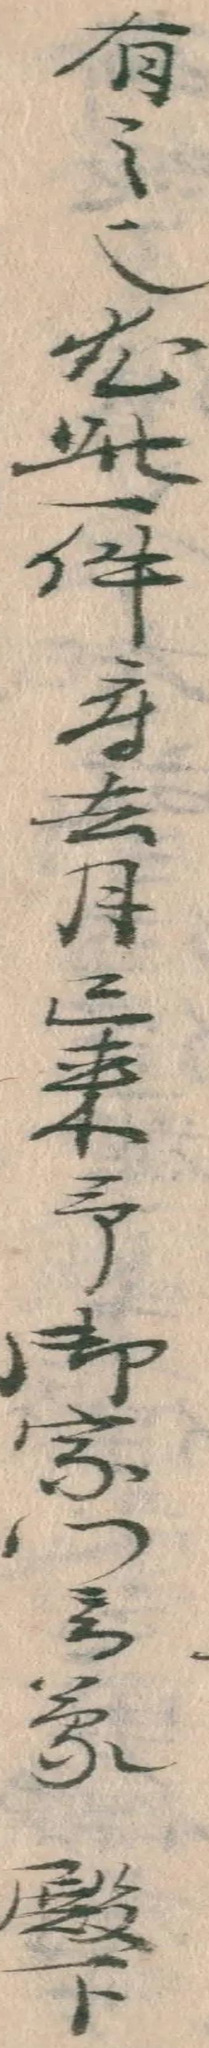有之也尤此一件ニ付去月已来予御宗門ニ而蒙殿下
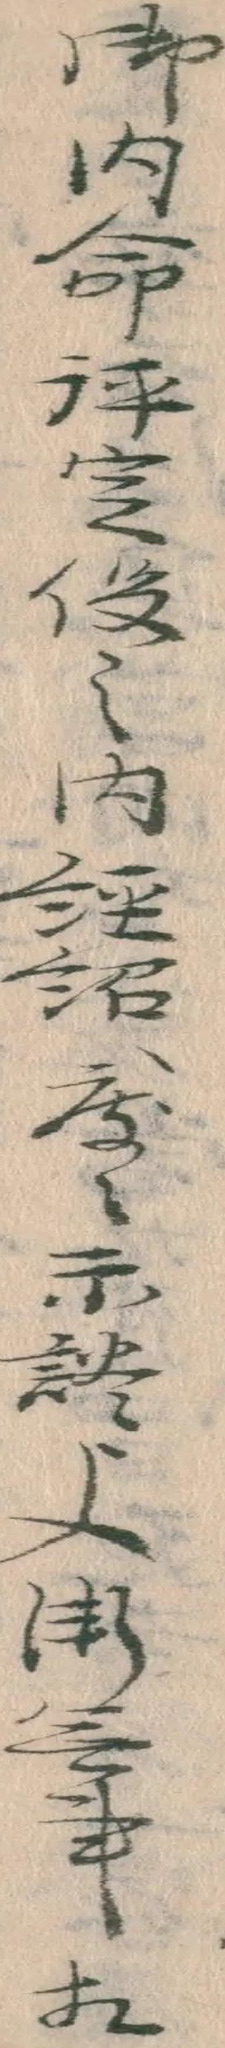御内命評定役之内経紹へ度々示談申入漸無事相
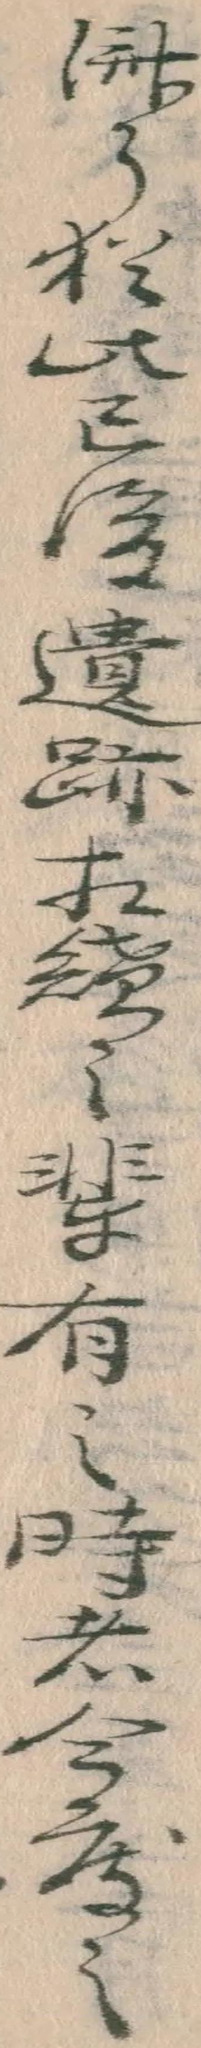済候猶此已後遺跡相續之輩有之時者今度之
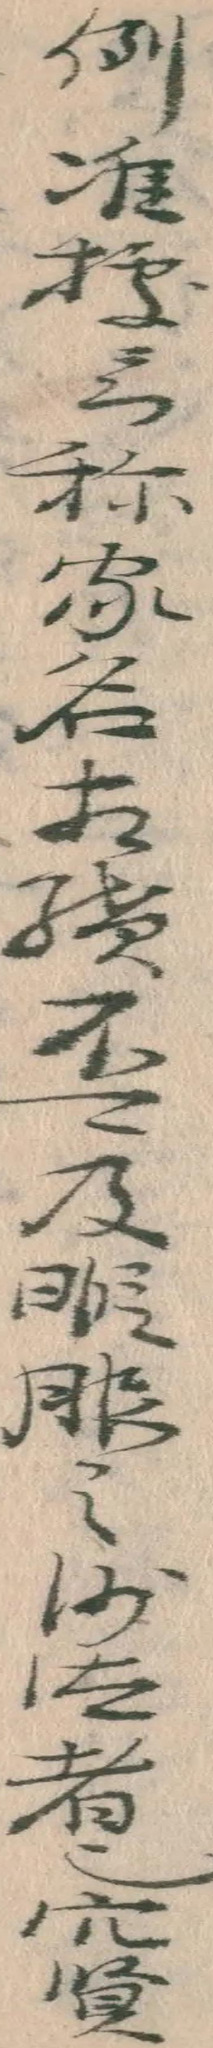例准拠にて称家名相続不可及段暇服之沙汰者也穴賢
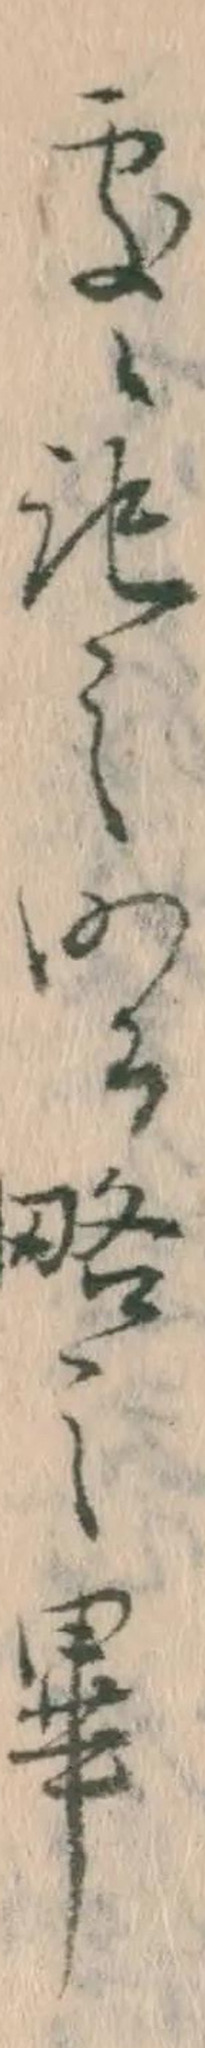處ニ記之仍而略之畢
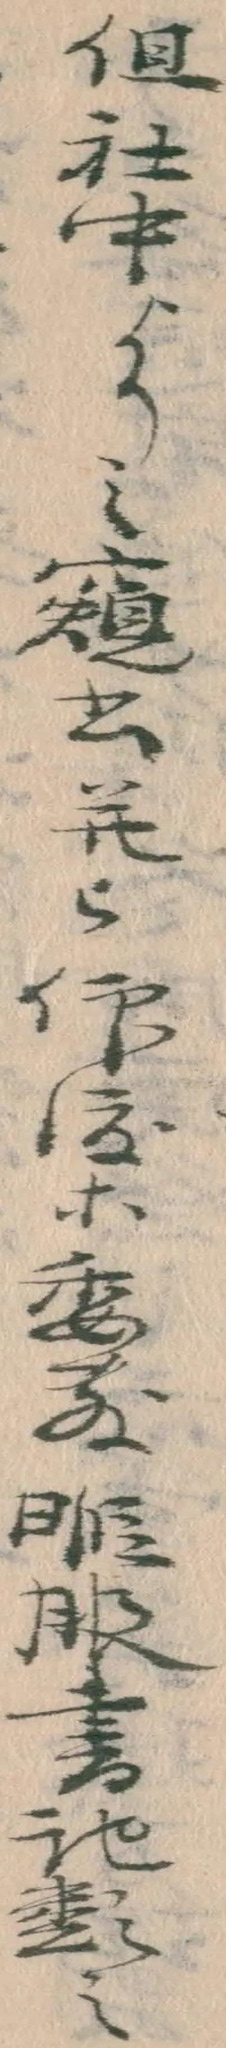但社中より之窺書并被仰渡等委敷暇服書記類之
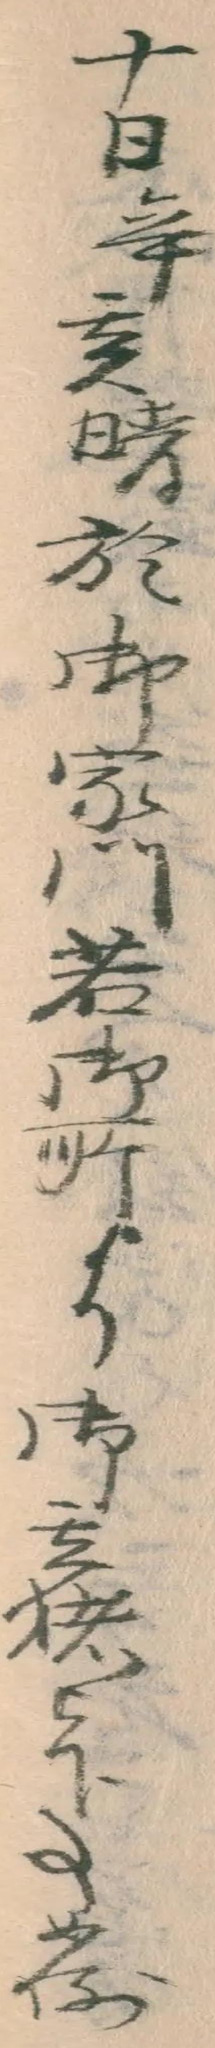十日辛亥晴於御家門若御所より御玄猪被下事如例
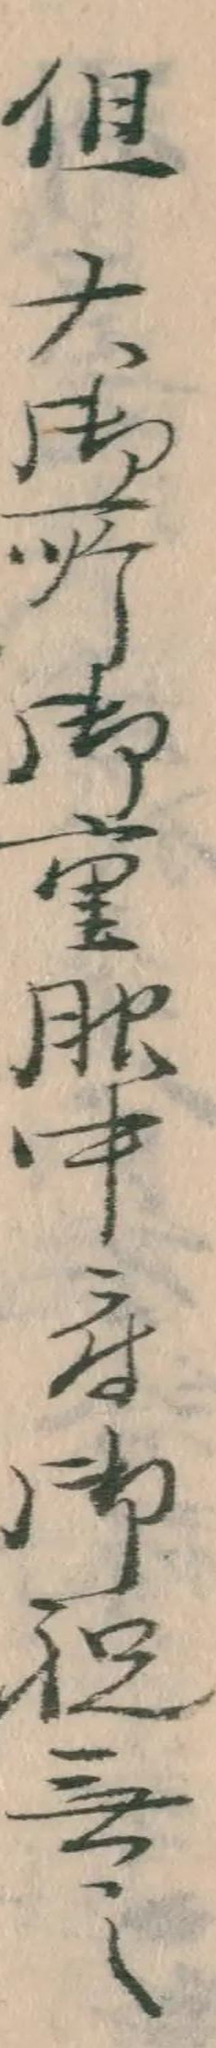但大御所御重服中ニ付御祝無之
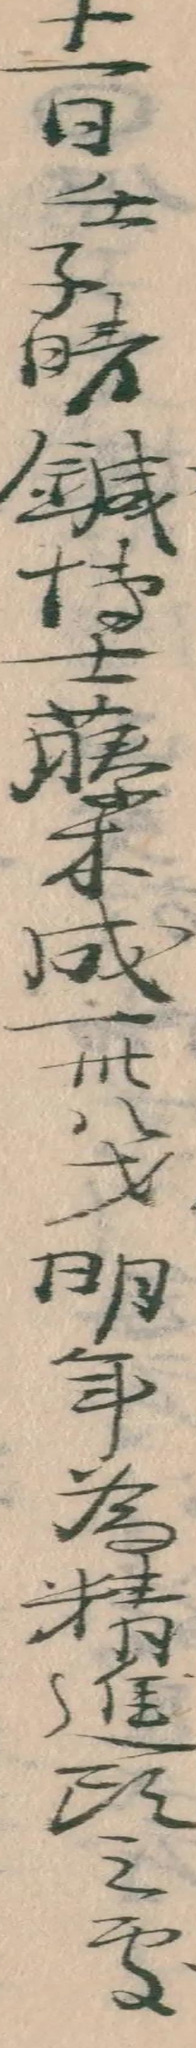十一日壬子晴鍼博士藤木成一卅八才明年為精進頭之處
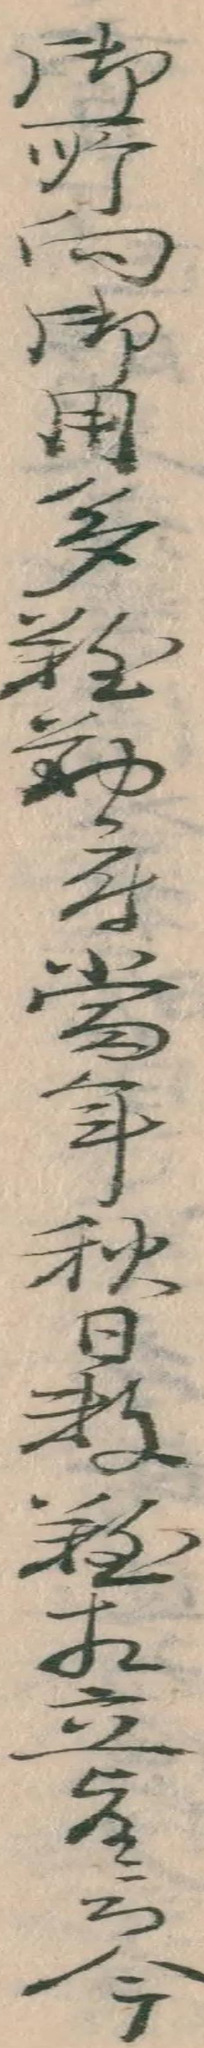御所向御用多難勤ニ付當年秋日数難相立迄ニ而今
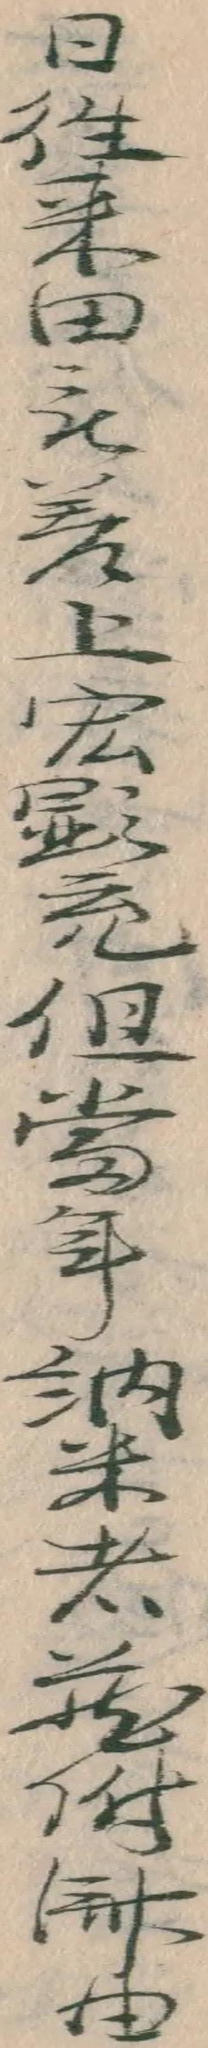日往来田被差上宏顕充但當年納米者蔵附済由
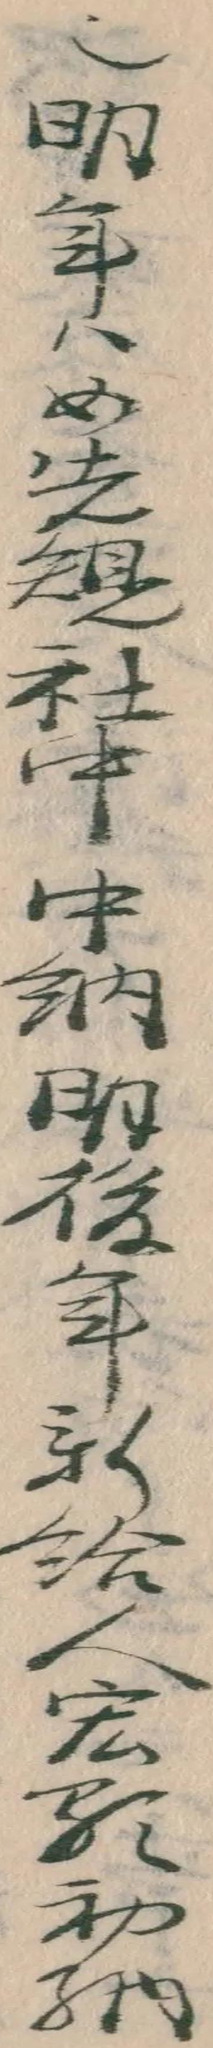也明年ハ如先規社中中納明後年新給人宏顕初納
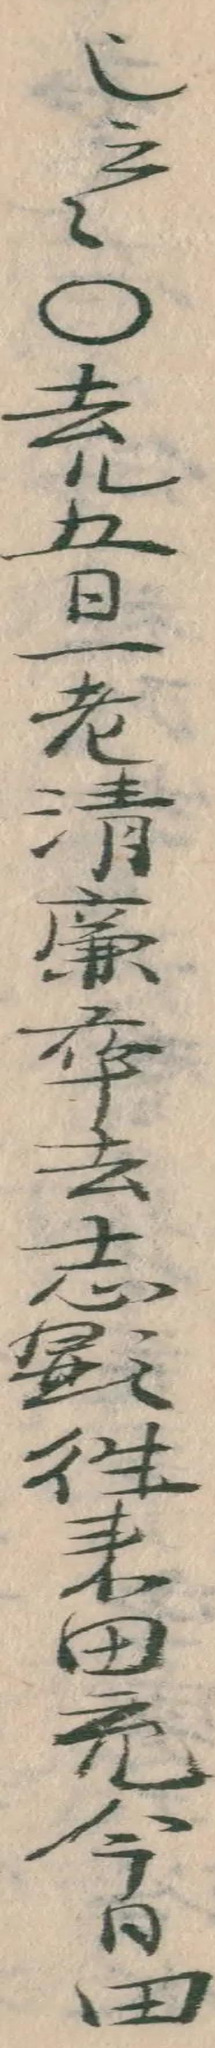也云〻○去ル五日一老清廉卒去志顕往来田充今日田
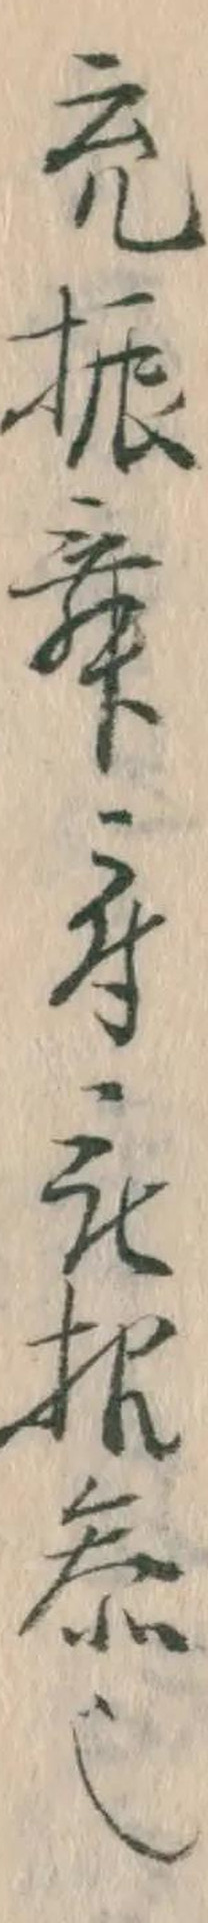充振舞ニ付被招参也
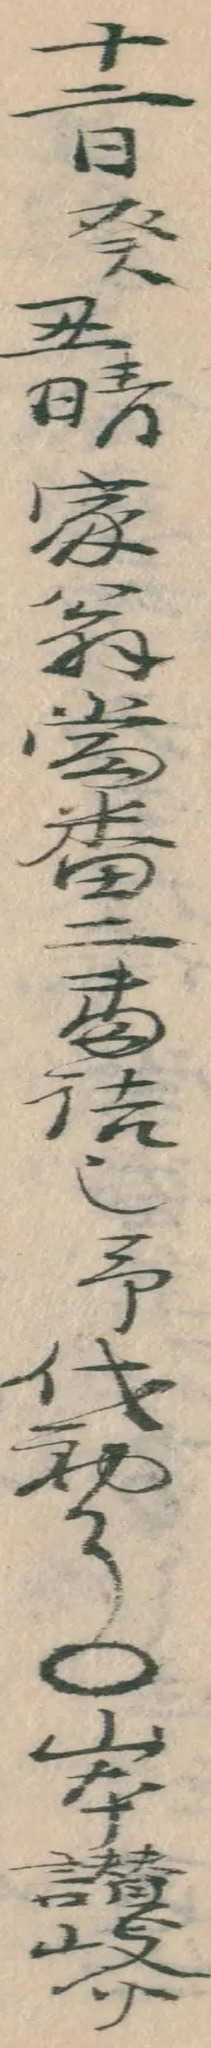十二日癸丑晴家翁當番二番詰也予代勤了○山本讃岐介
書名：賀茂社記録. 第63冊
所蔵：国立国会図書館 National Diet Library, JAPAN
